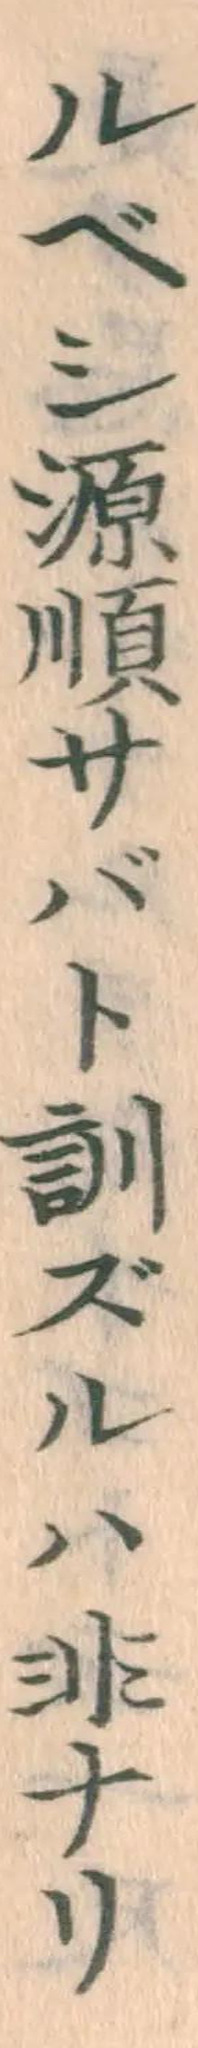ルベシ源順サバト訓ズルハ非ナリ

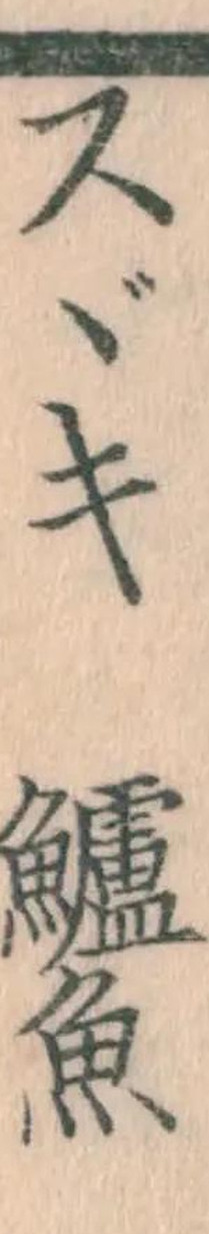スヾキ鱸魚
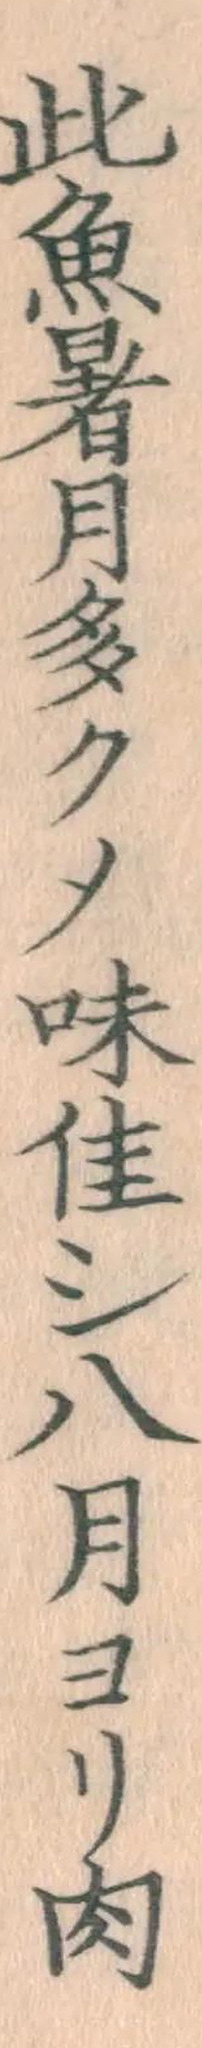此魚暑月多クシテ味佳シ八月ヨリ肉
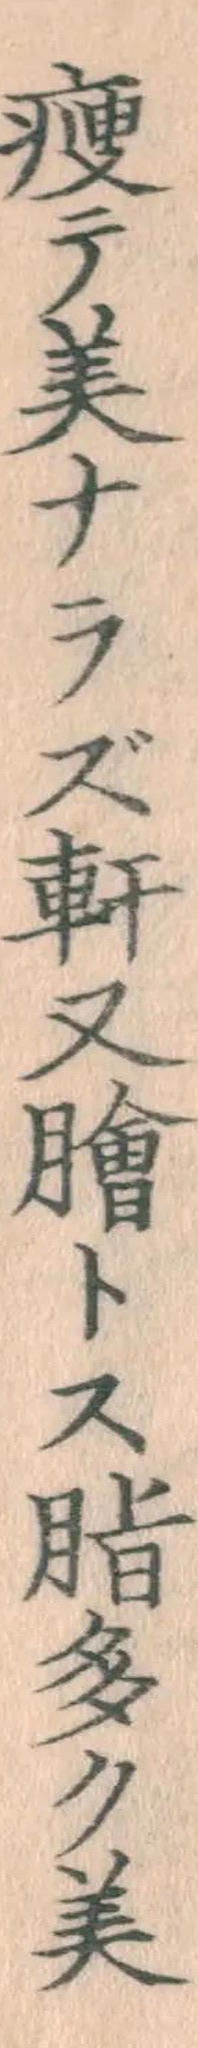痩テ美ナラズ軒又膾トス脂多ク美
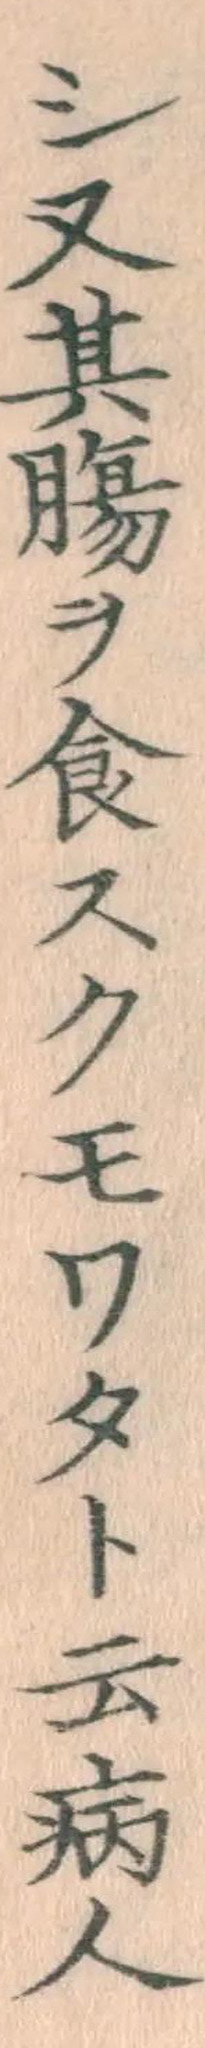シ又其腸ヲ食スクモワタト云病人
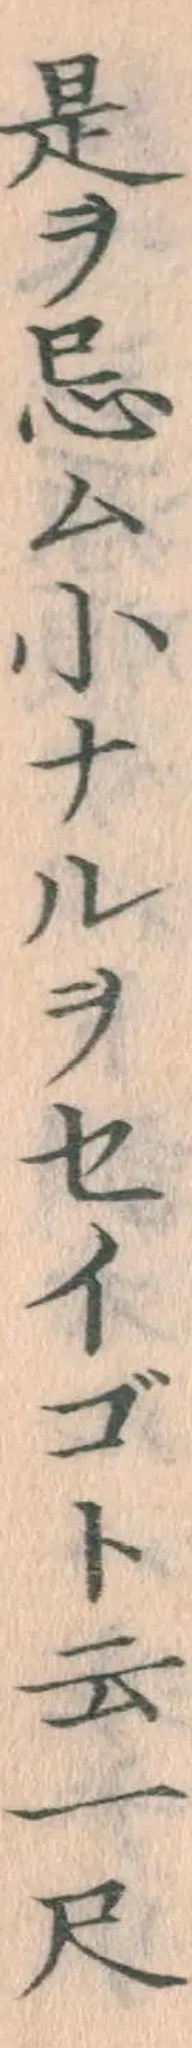是ヲ忌ム小ナルヲセイゴト云一尺
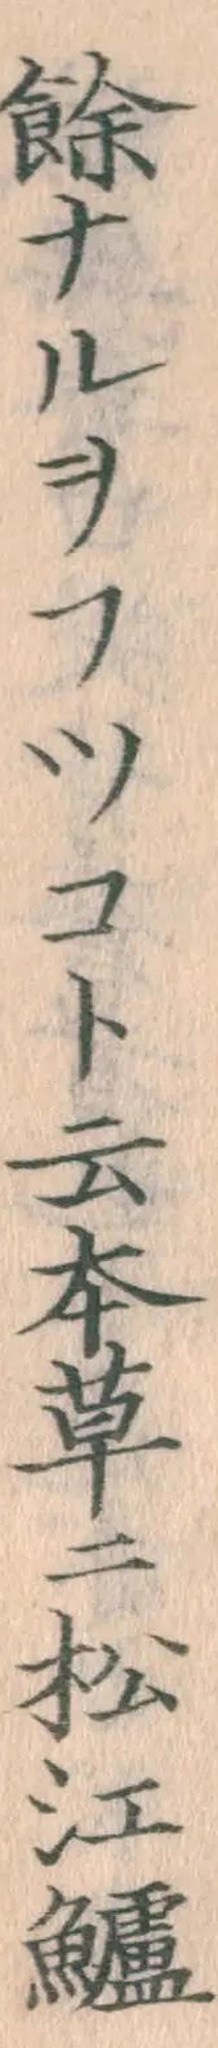余ナルヲフツコト云本草ニ松江鱸
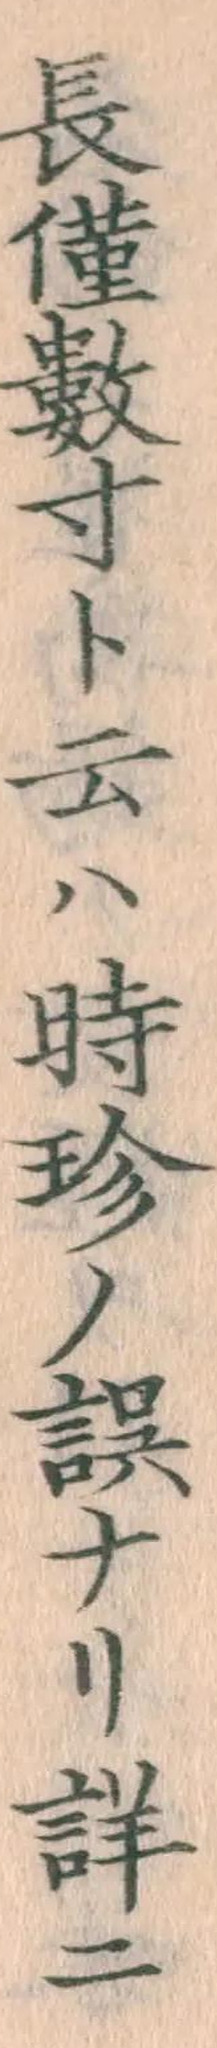長僅数寸ト云ハ時珍ノ誤ナリ詳ニ
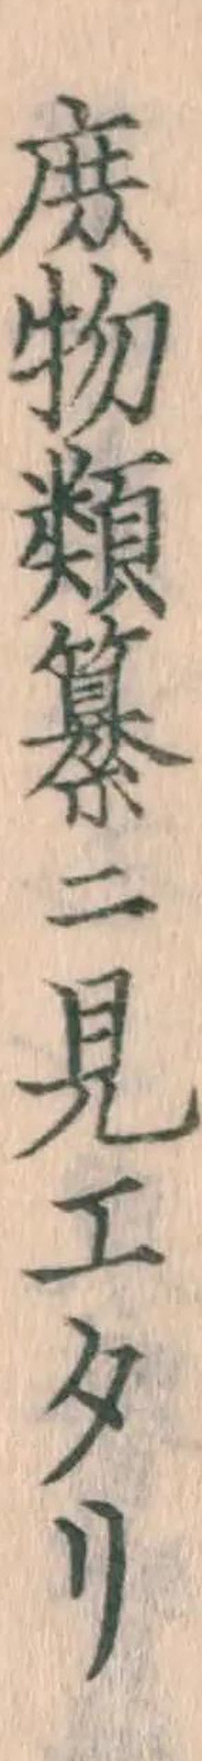庶物類纂ニ見エタリ
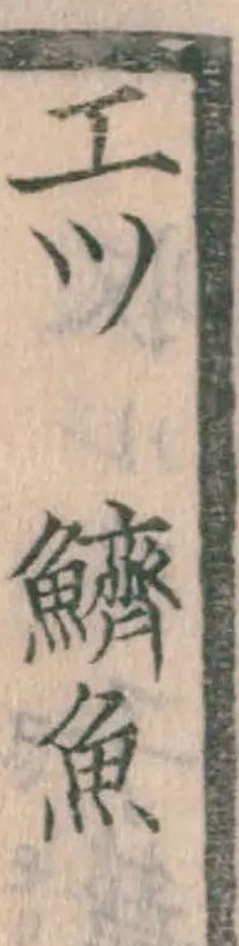エツ鱭魚
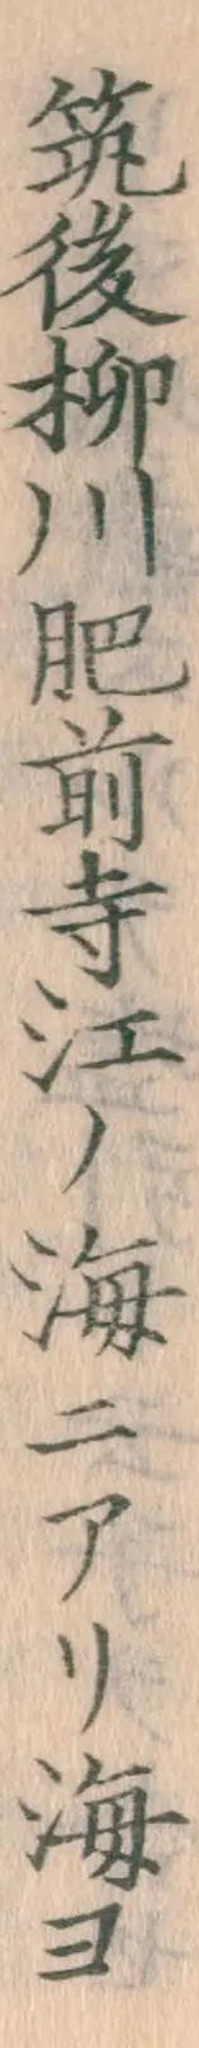筑後柳川肥前寺江ノ海ニアリ海ヨ
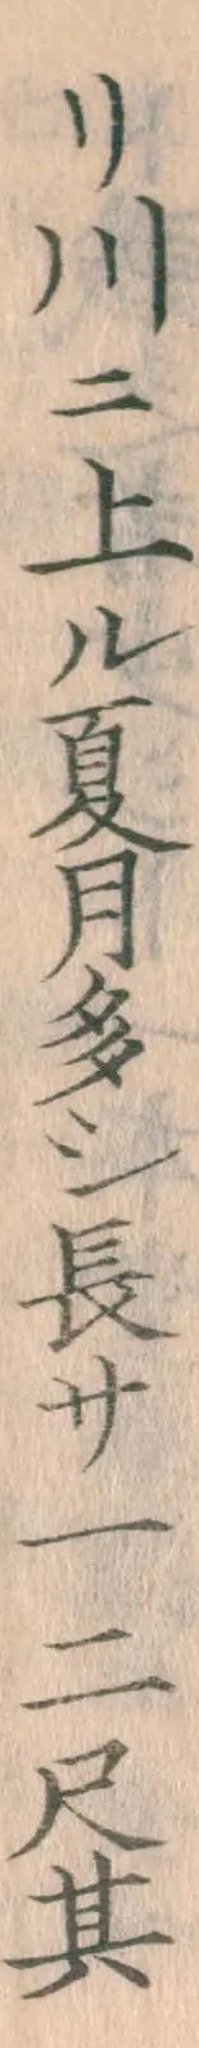リ川ニ上ル夏月多シ長サ一二尺其
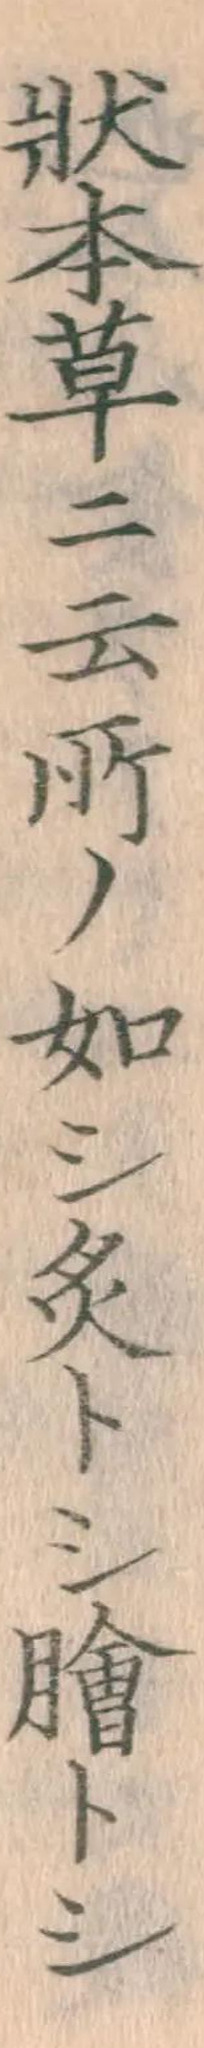状本草ニ云所ノ如シ炙トシ膾トシ
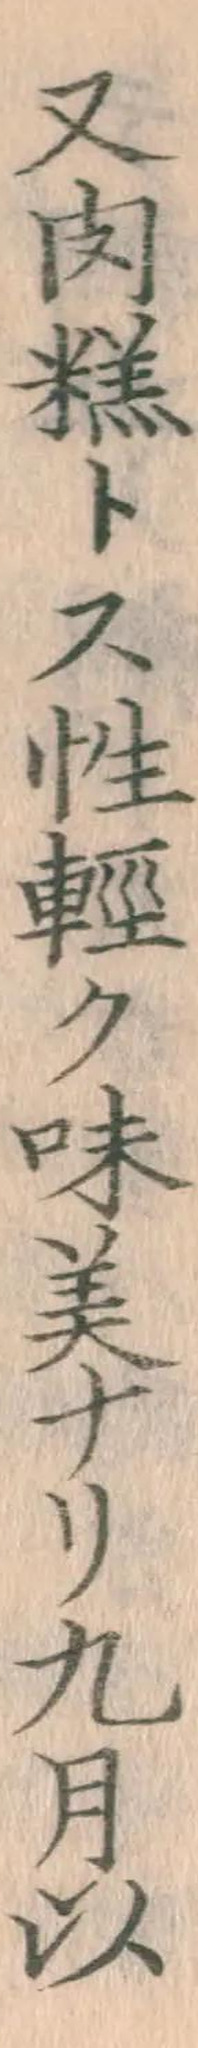又肉糕トス性軽ク味美ナリ九月以
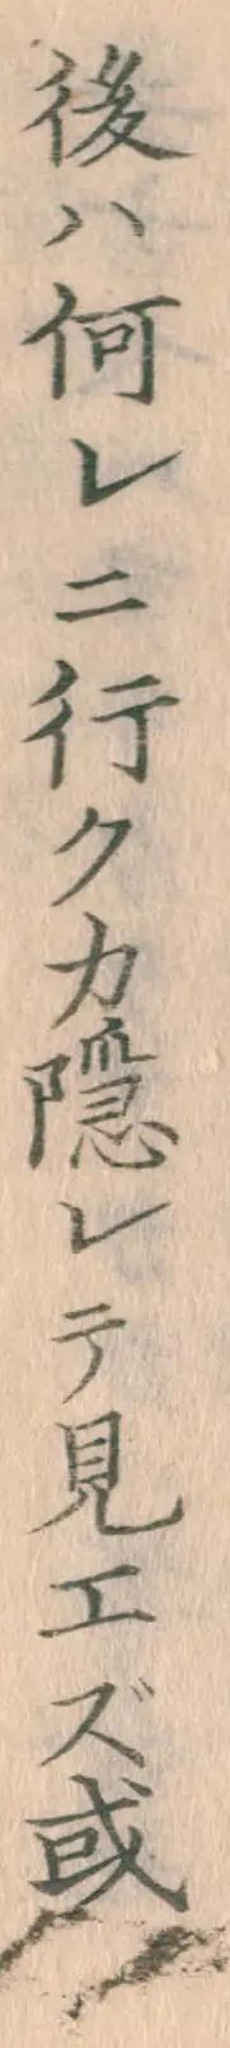後ハ何レニ行クカ隠レテ見エズ或
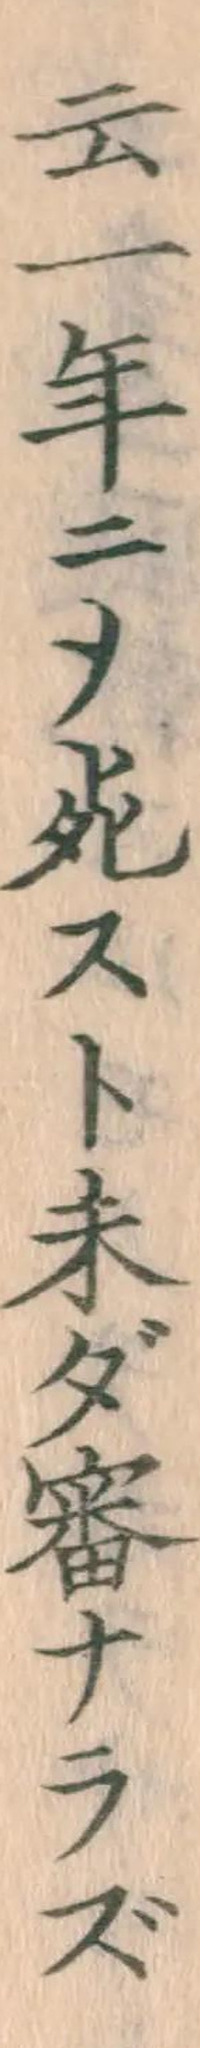云一年ニシテ死スト未ダ審ナラズ
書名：皇和魚譜 2巻
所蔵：国立国会図書館 National Diet Library, JAPAN
